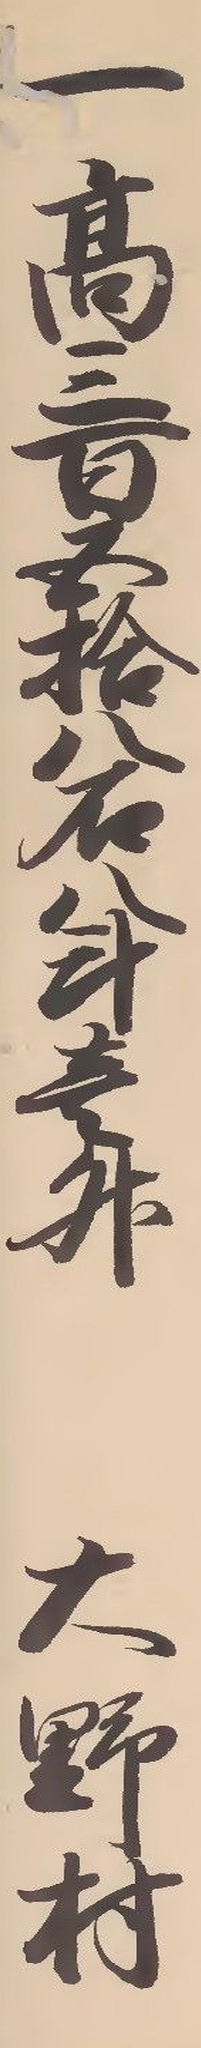一高三百五拾八石八斗壱升大野村
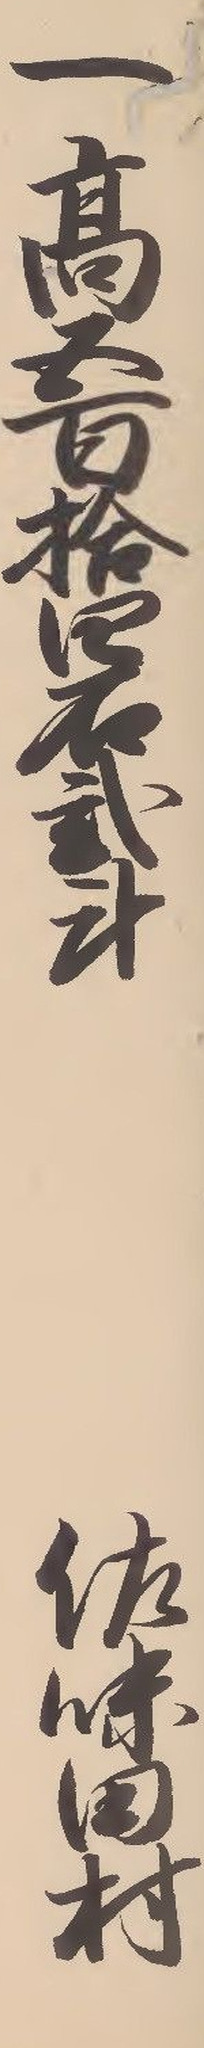一高五百拾四石弐斗佐味田村
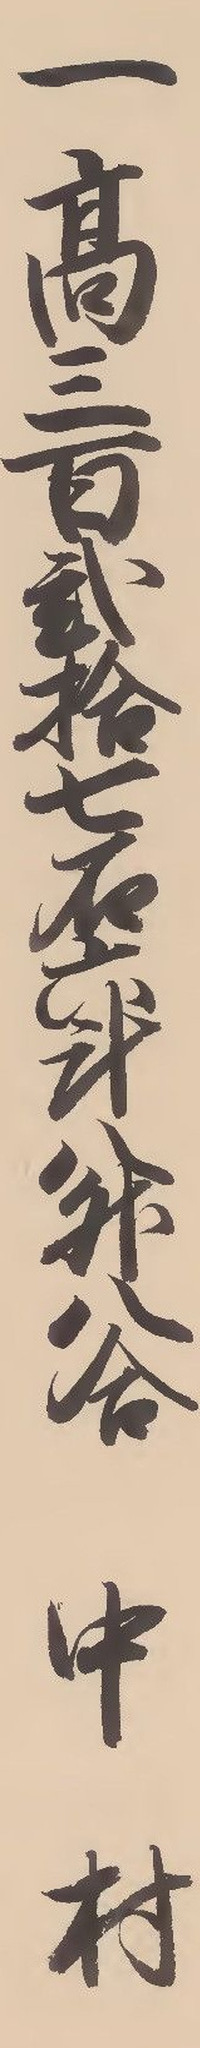一高三百弐拾七石六斗八升八合中村
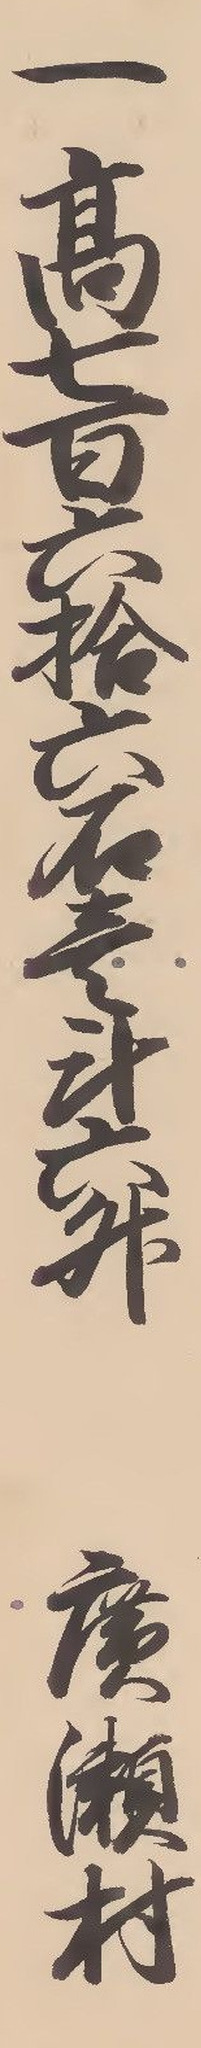一高七百六拾六石壱斗六升広瀬村

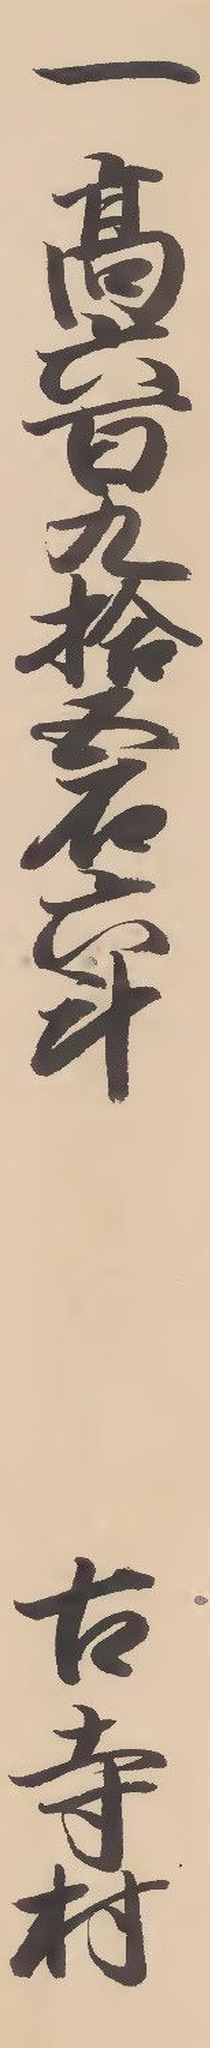一高六百九拾五石六斗古寺村
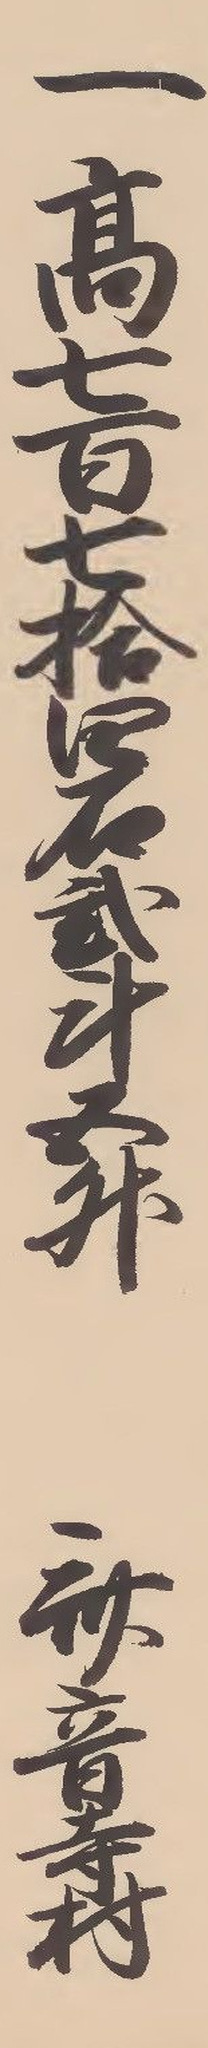一高七百七拾四石弐斗五升斎音寺村
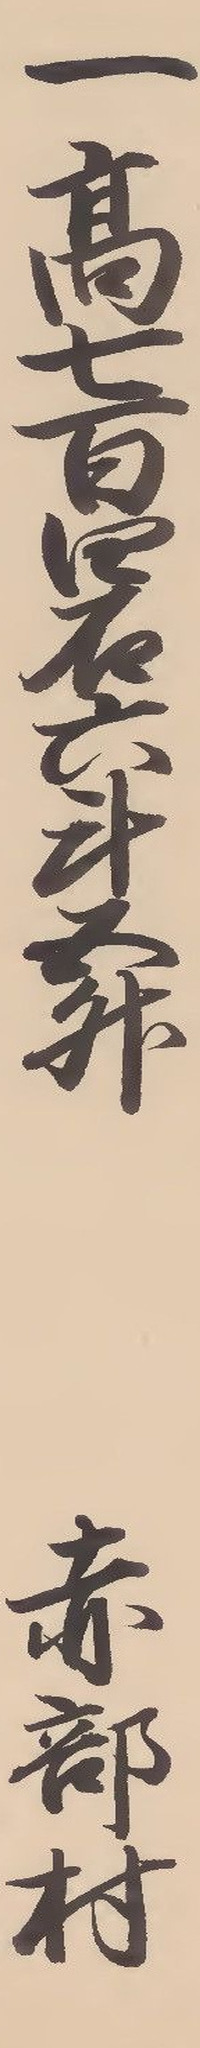一高七百四石六斗五升赤部村
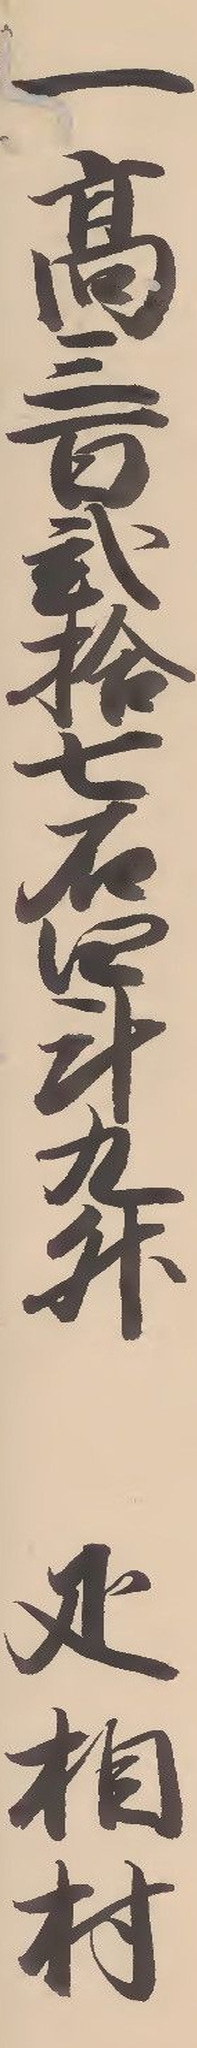一高三百弐拾七石四斗九升疋相村
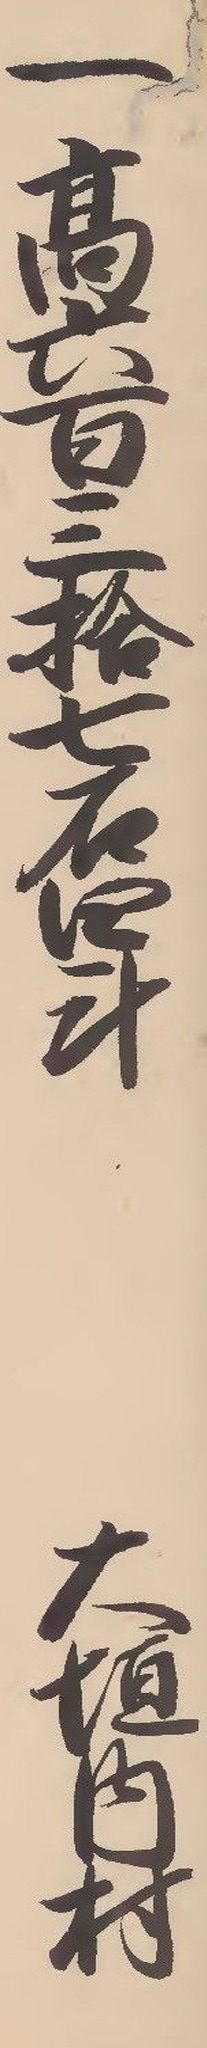一高六百三拾七石四斗大垣内村
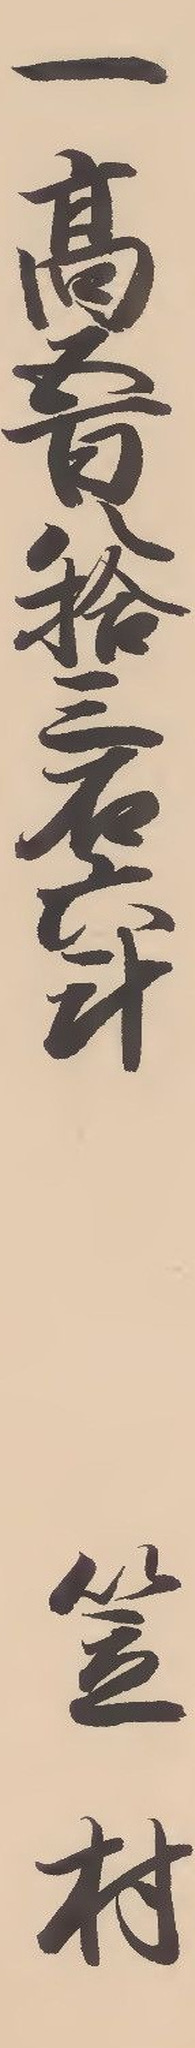一高五百八拾三石六斗笠村
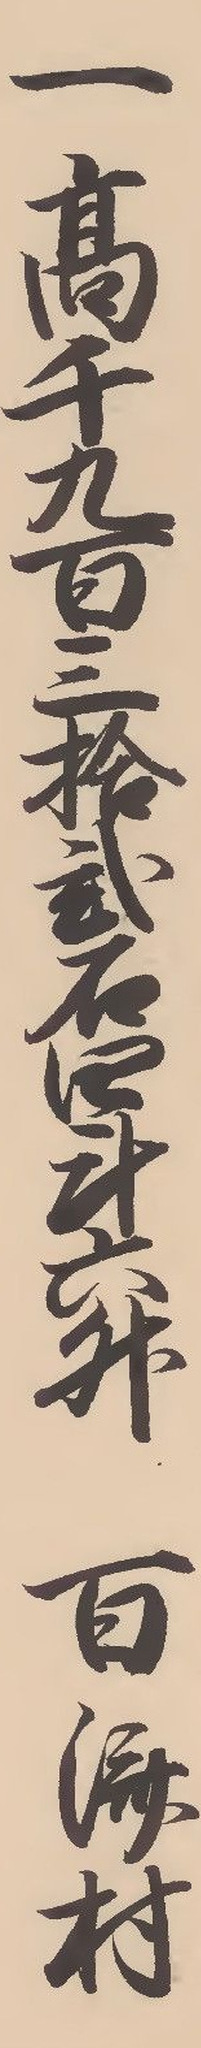一高千九百三拾弐石四斗六升百済村
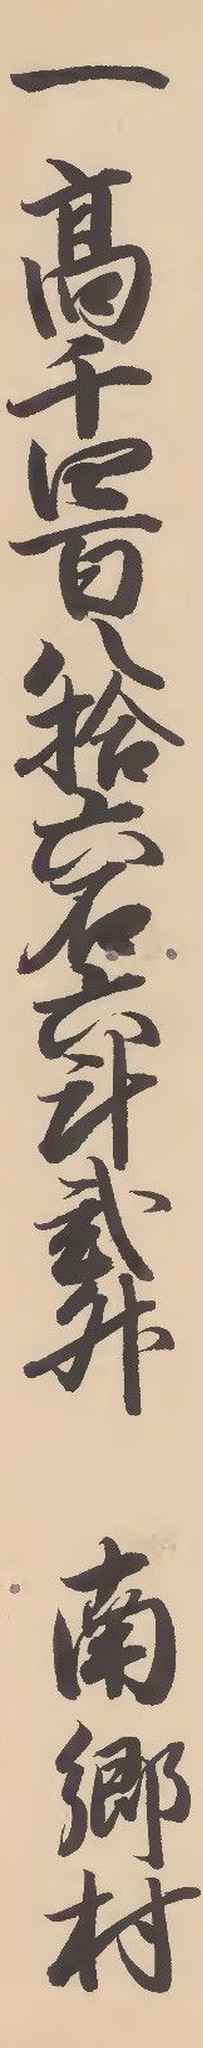一高千四百八拾六石六斗弐升南郷村

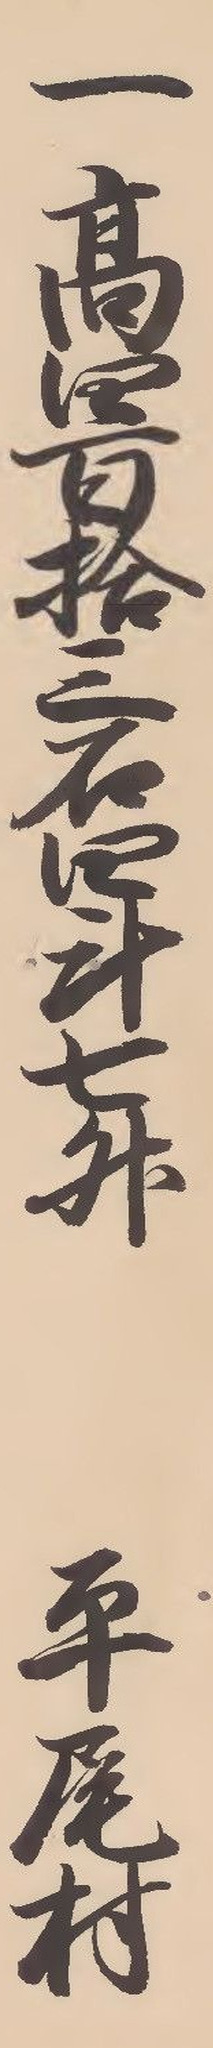一高四百拾三石四斗七升平尾村
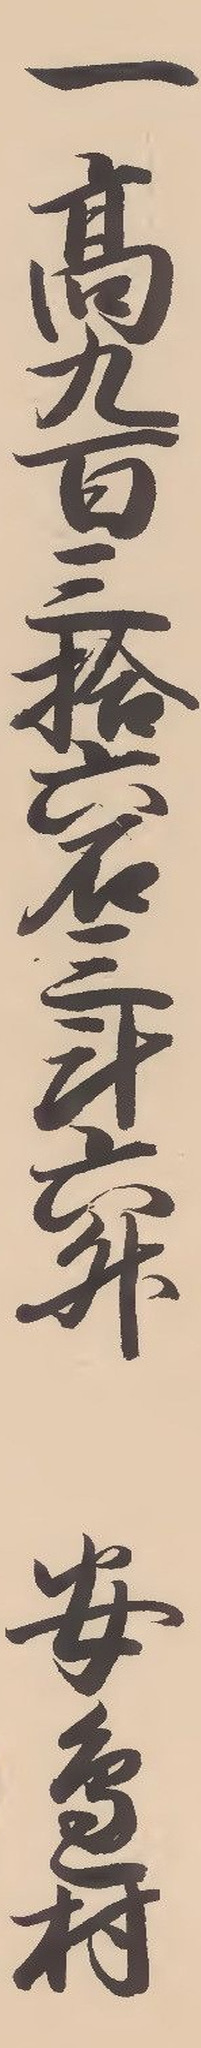一高九百三拾六石三斗六升安辺村
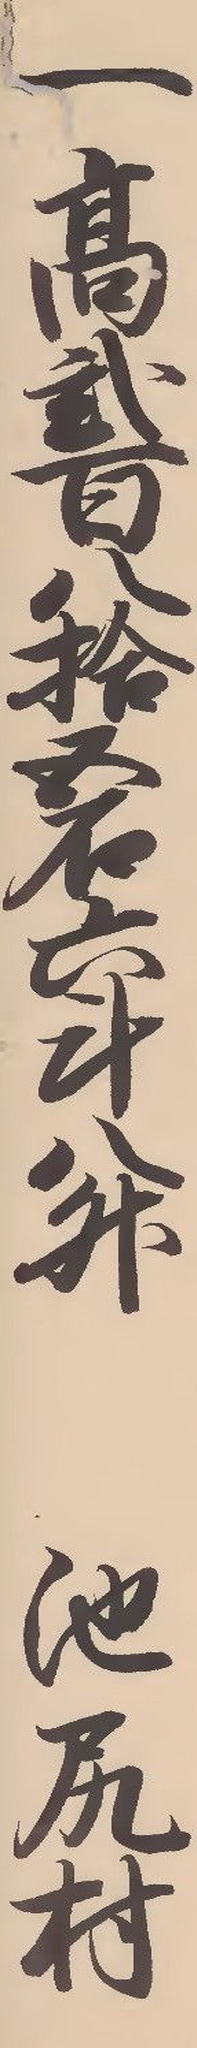一高弐百八拾五石六斗八升池尻村
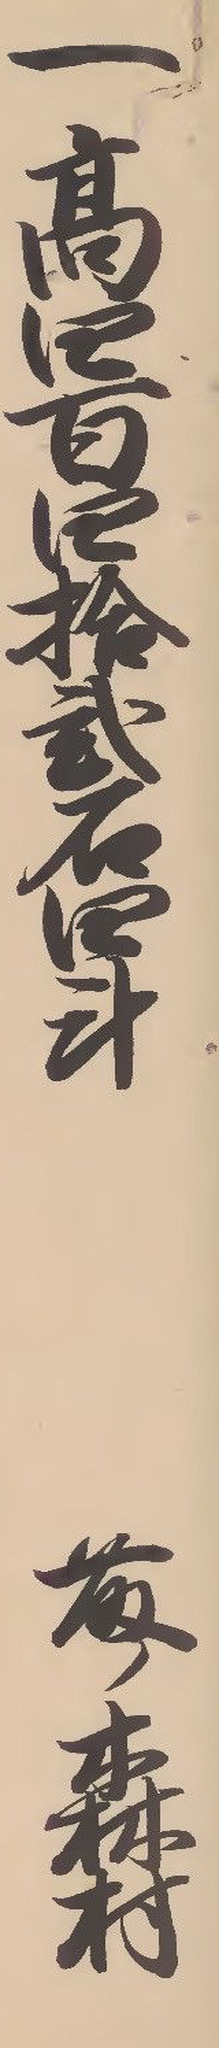一高四百四拾弐石四斗藤ノ森村
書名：大和国郷帳
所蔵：国立公文書館 National Archives of Japan
